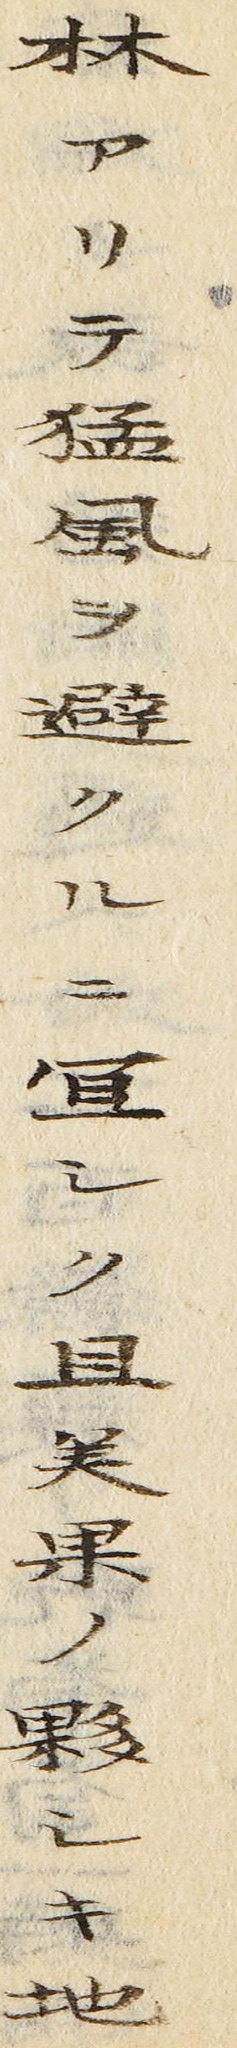林アリテ猛風ヲ避クルニ宜シク且美果ノ夥シキ地
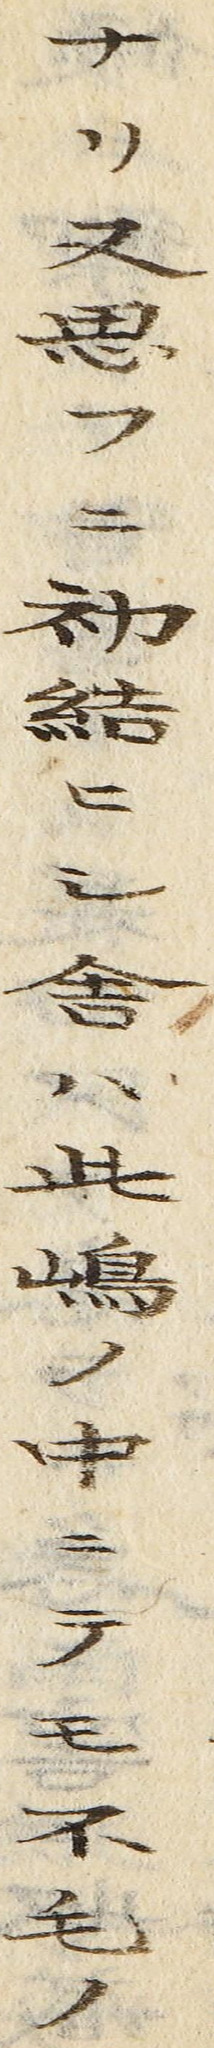ナリ又思フニ初結ヒシ舎ハ此島ノ中ニテモ不毛ノ
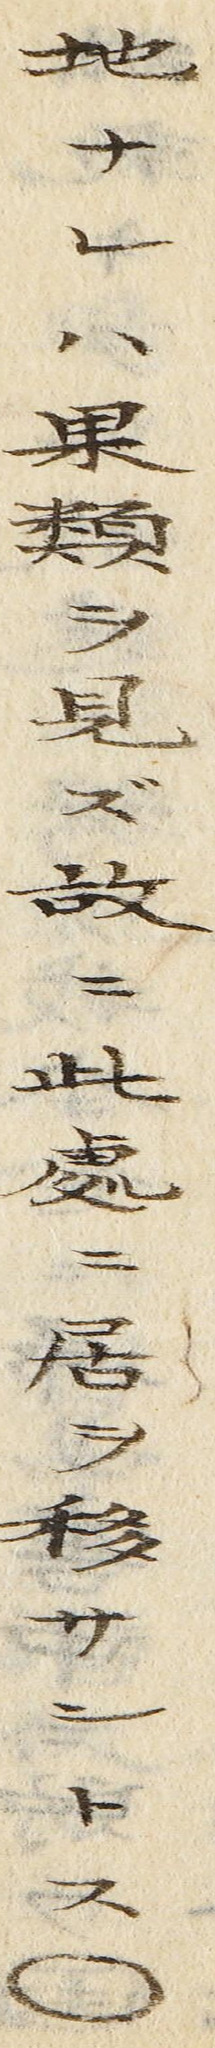地ナレハ果類ヲ見ズ故ニ此処ニ居ヲ移サントス◯
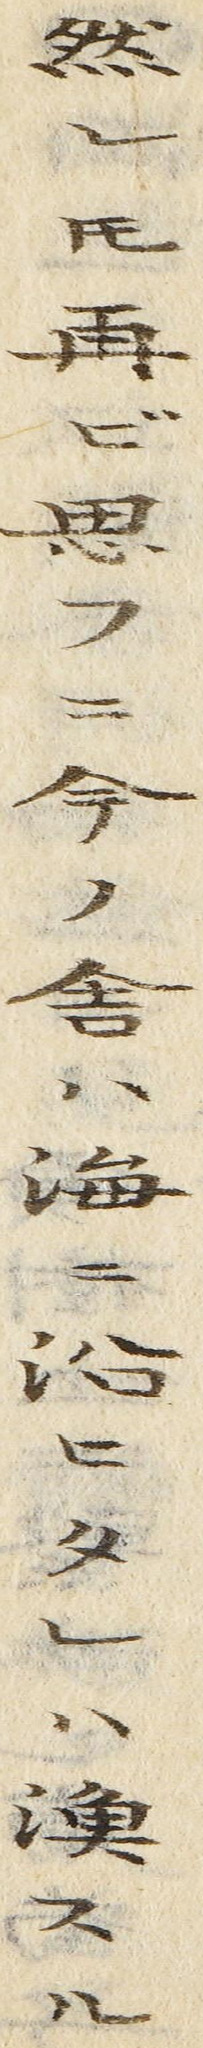然レトモ再ビ思フニ今ノ舎ハ海ニ沿ヒタレハ漁スル
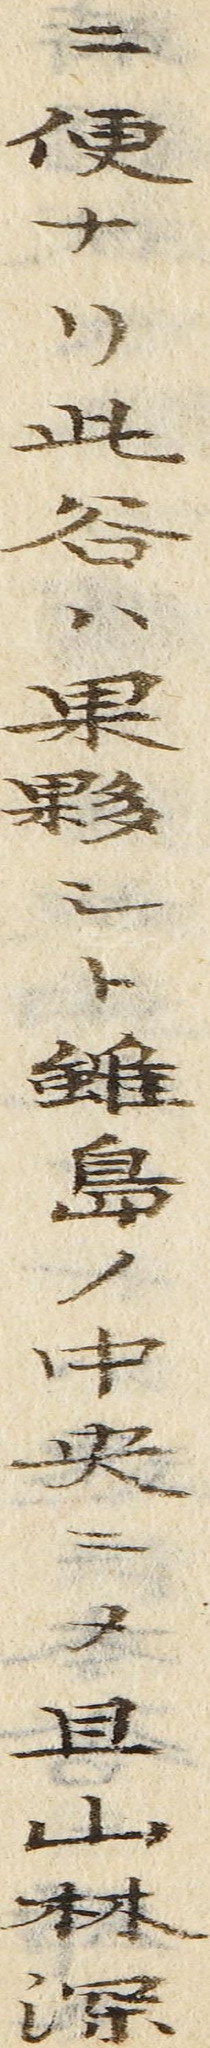ニ便ナリ此谷ハ果夥シト雖島ノ中央ニシテ且山林深
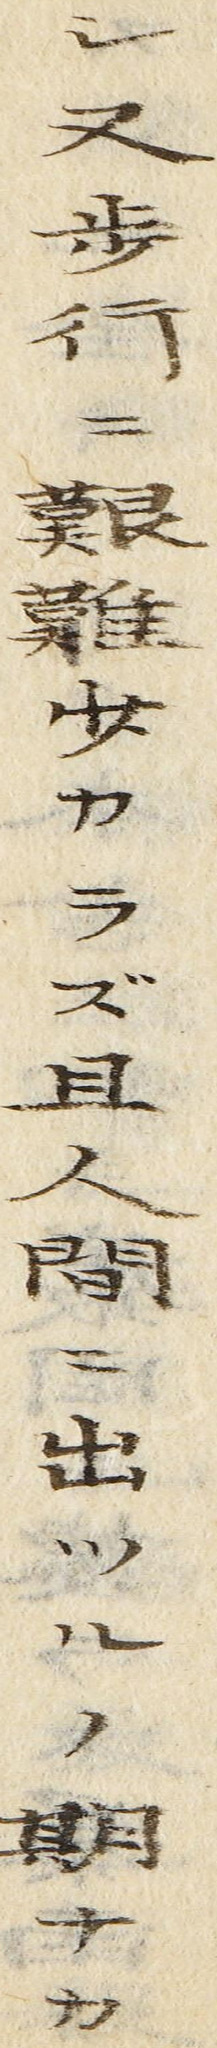シ又歩行ニ艱難少カラズ且人間ニ出ツルノ期ナカ
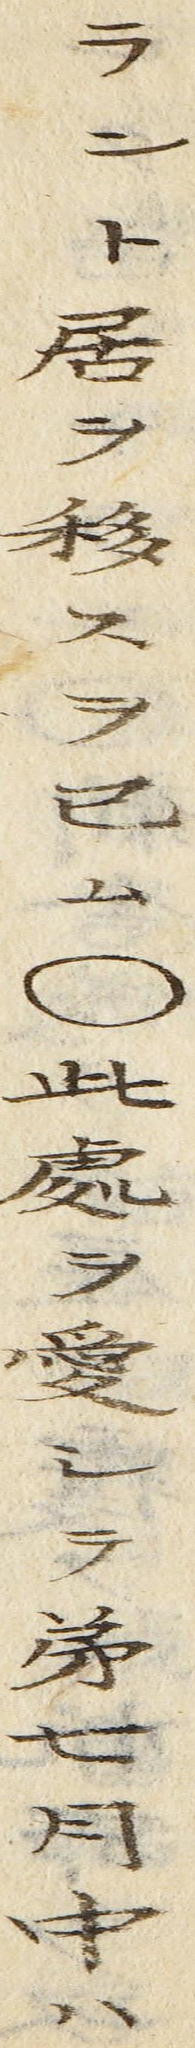ラント居ヲ移スヲ已ム◯此処ヲ愛シテ第七月中ハ
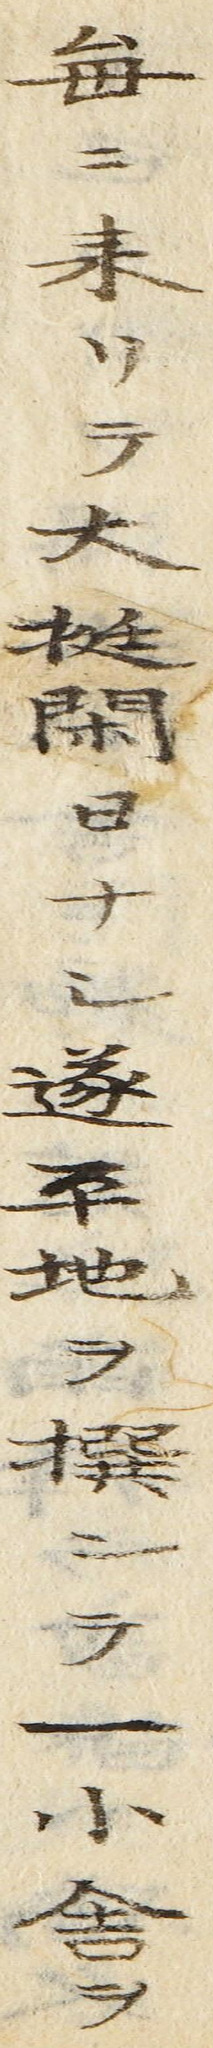毎ニ来リテ大挺閑日ナシ遂平地ヲ撰ンテ一小舎ヲ
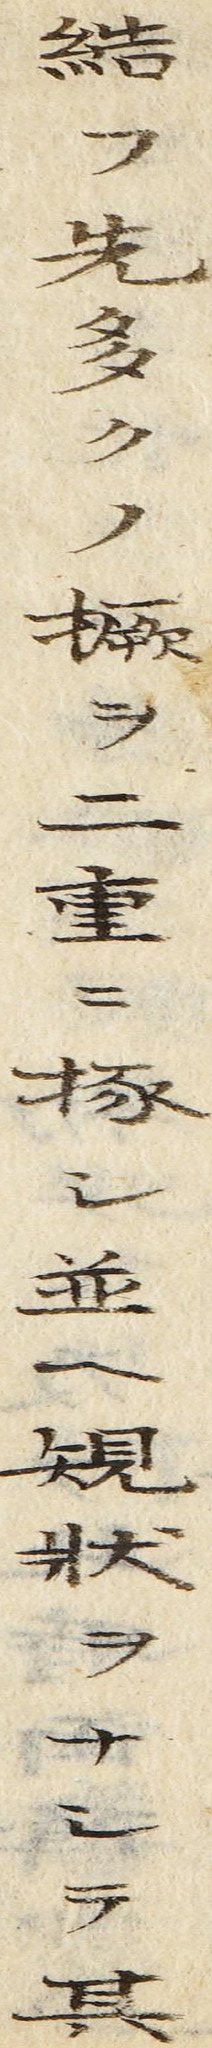結フ先多クノ橛ヲ二重ニ椓シ並ヘ䂓状ヲナシテ其
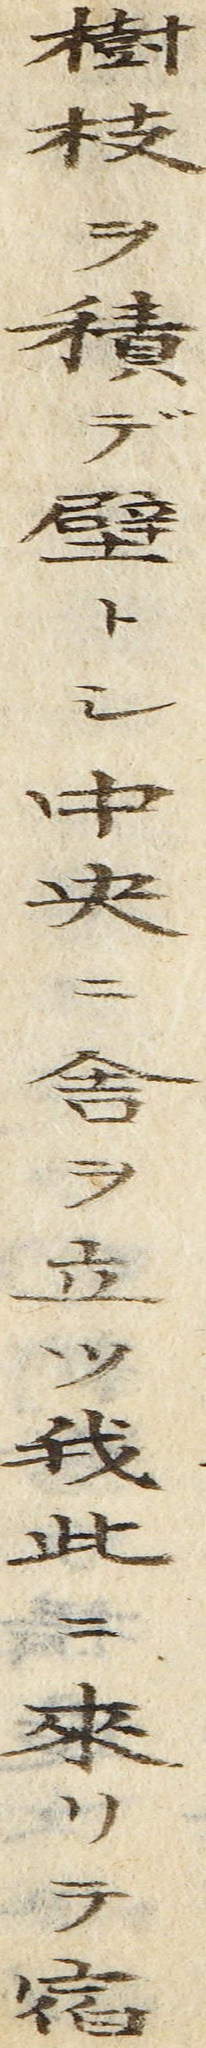樹枝ヲ積デ壁トシ中央ニ舎ヲ立ツ我此ニ来リテ宿
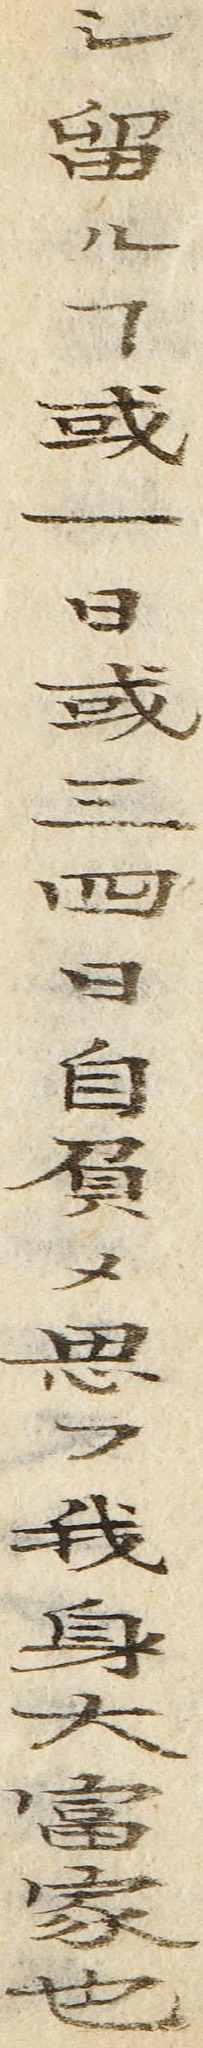シ留ルコト或一日或三四日自負シテ思フ我身大富家也

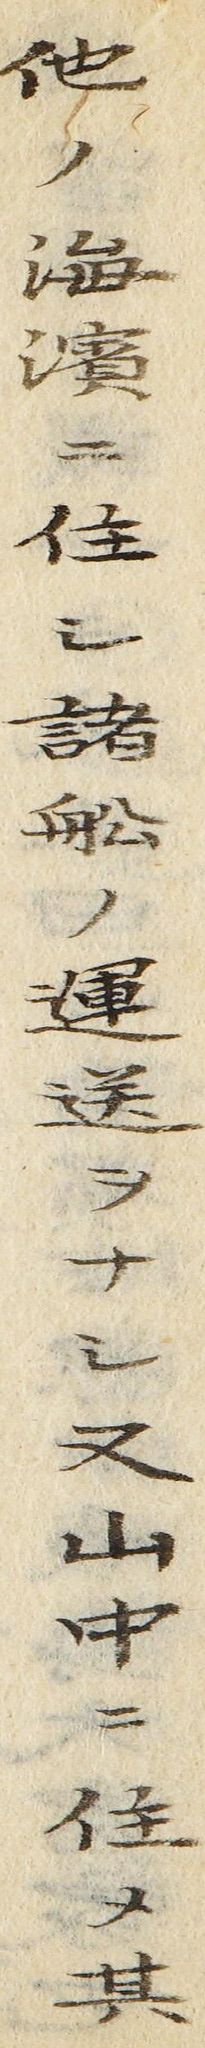他ノ海浜ニ住シ諸船ノ運送ヲナシ又山中ニ住シテ其
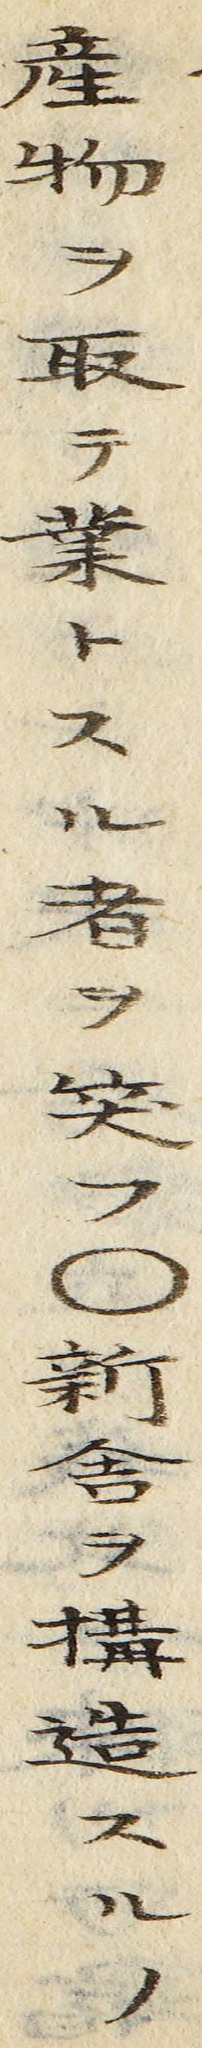産物ヲ取テ業トスル者ヲ笑フ◯新舎ヲ構造スルノ
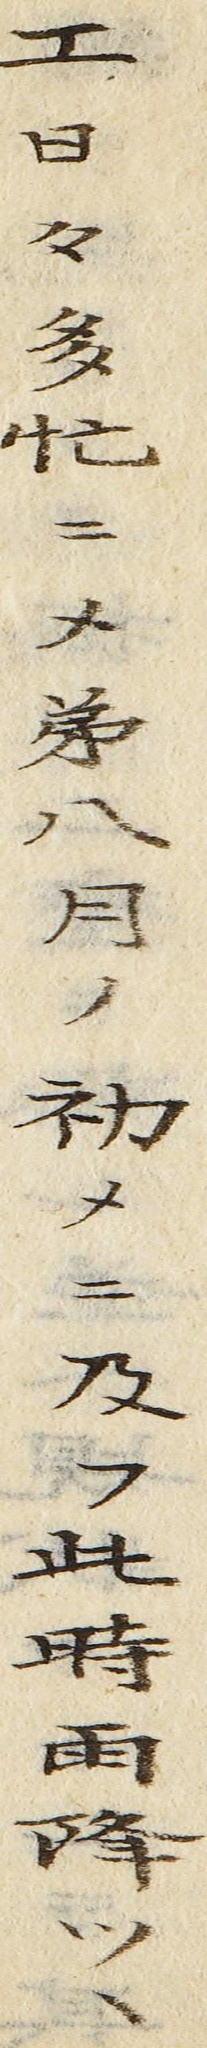工日々多忙ニシテ第八月ノ初メニ及フ此時雨降ツヽ
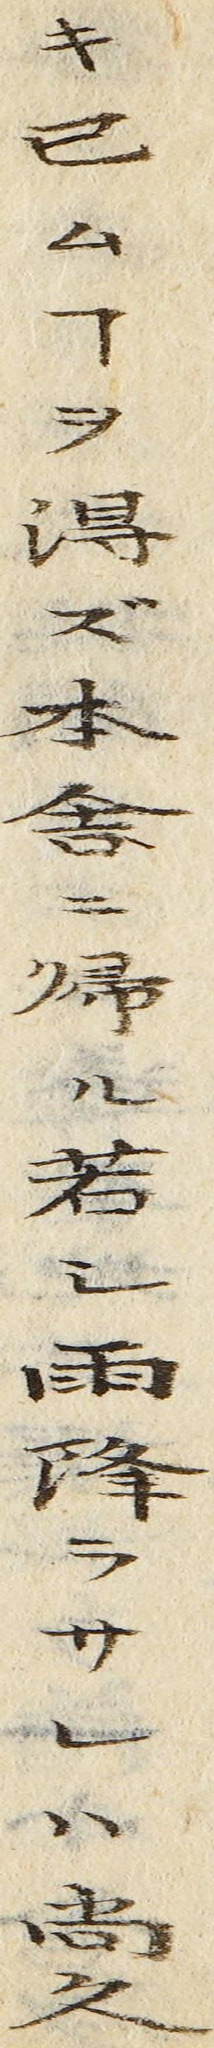キ已ムコトヲ得ズ本舎ニ帰ル若シ雨降ラサレハ尚久
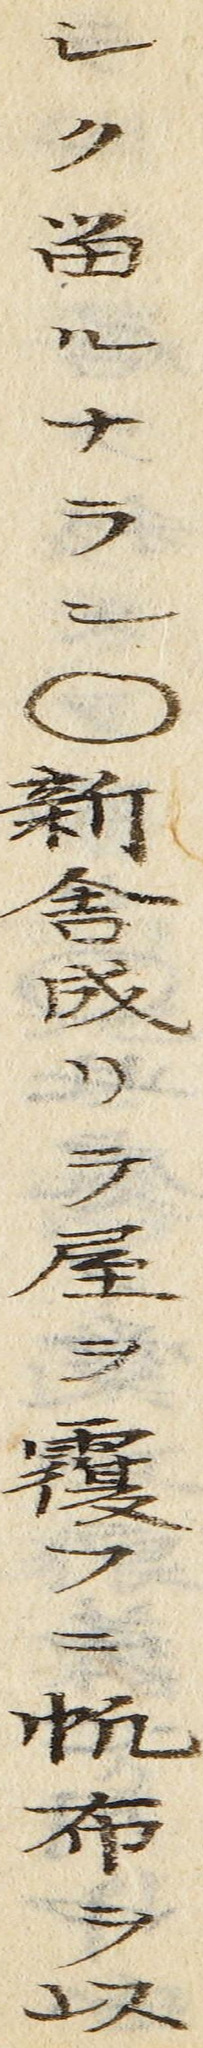シク留ルナラン◯新舎成リテ屋ヲ䨱フニ帆布ヲ以
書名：漂流紀事
